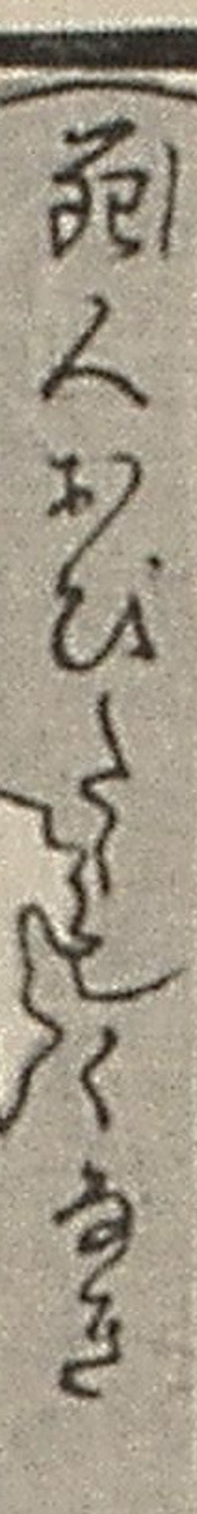死人おびたゝしくなき
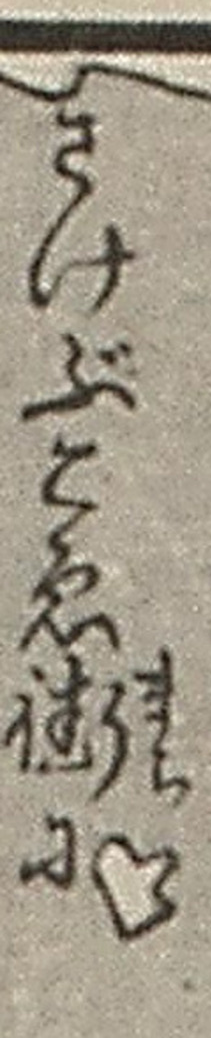さけぶこゑ街に
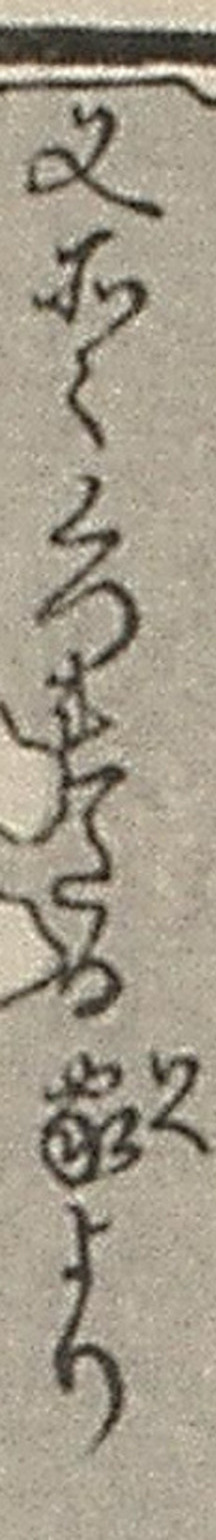又所々くつれたる家より
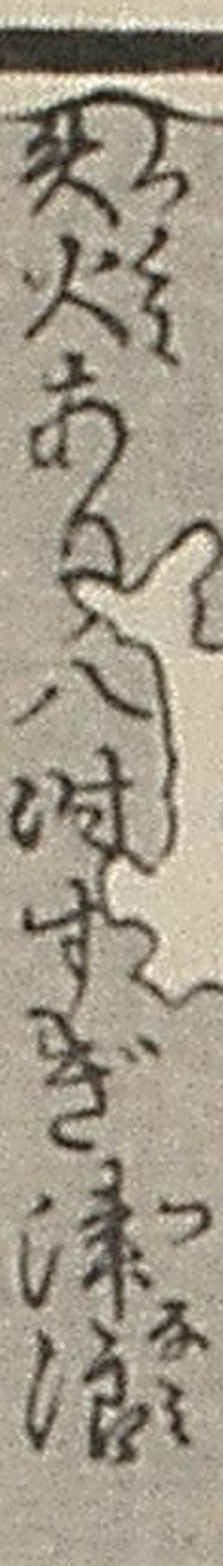失火あり八時すぎ津波
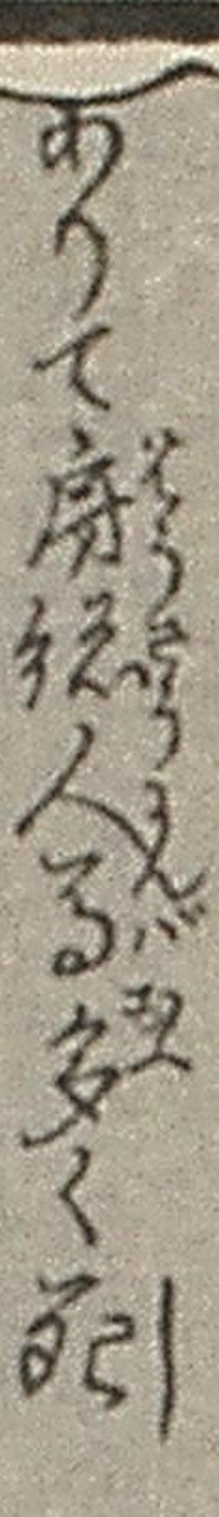ありて房総人馬多く死
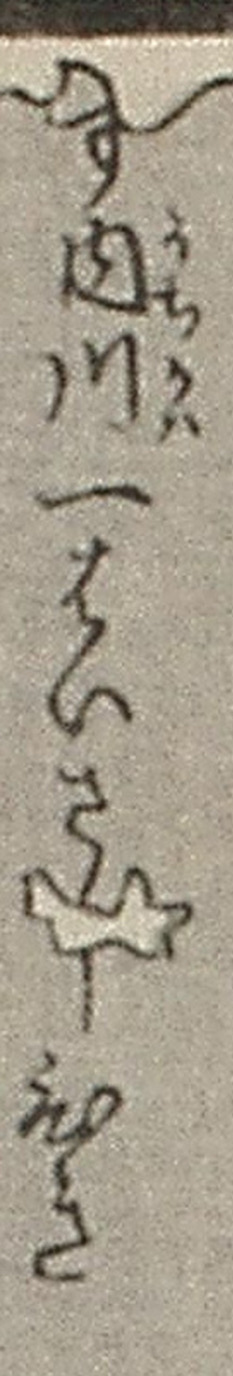す内川一はいさしひき
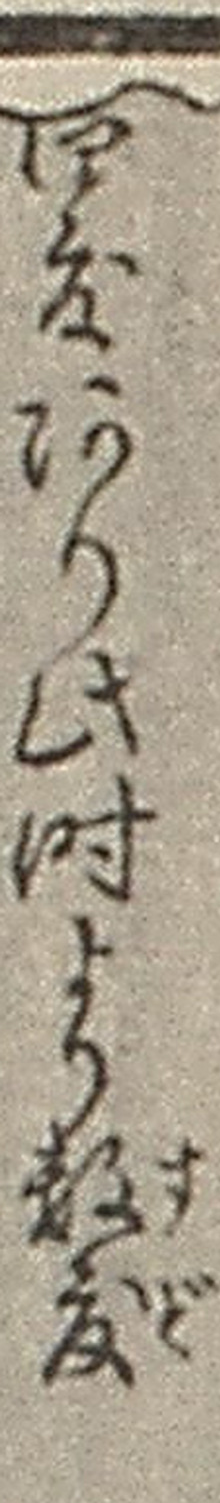四度あり此時より数度
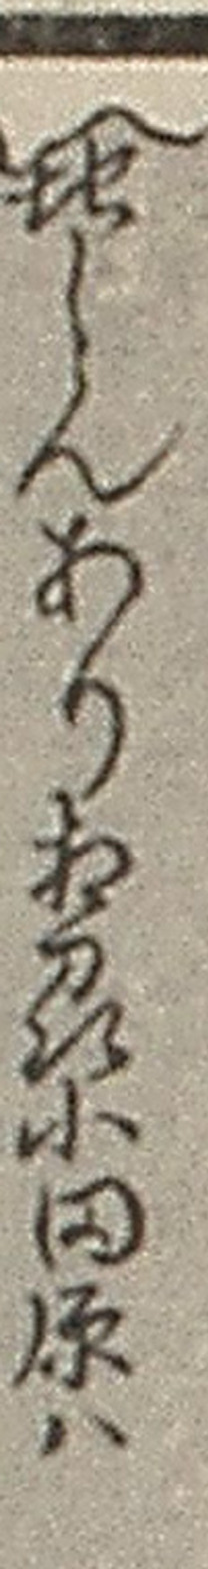地しんあり相州小田原は
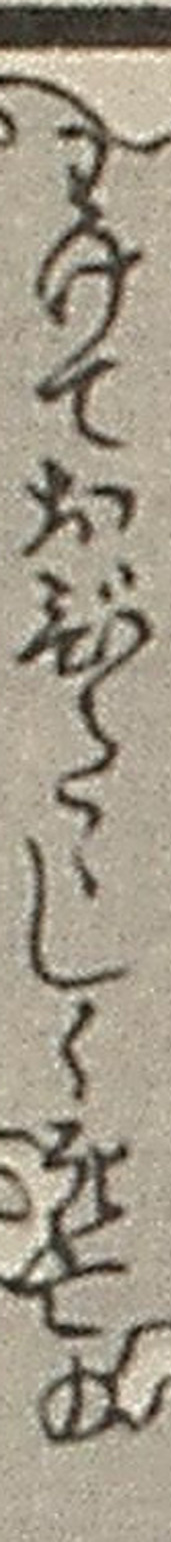わけておびたゝしく死亡の
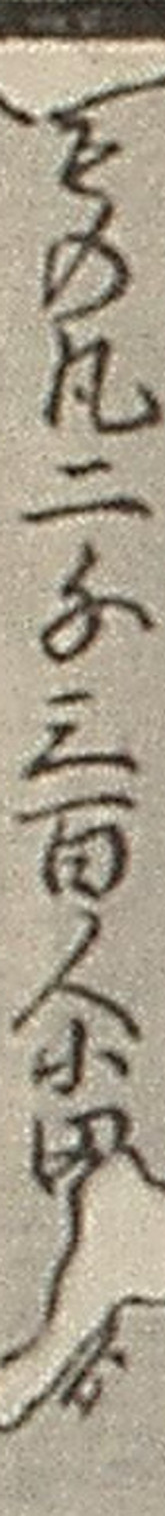もの凡二千三百人小田より
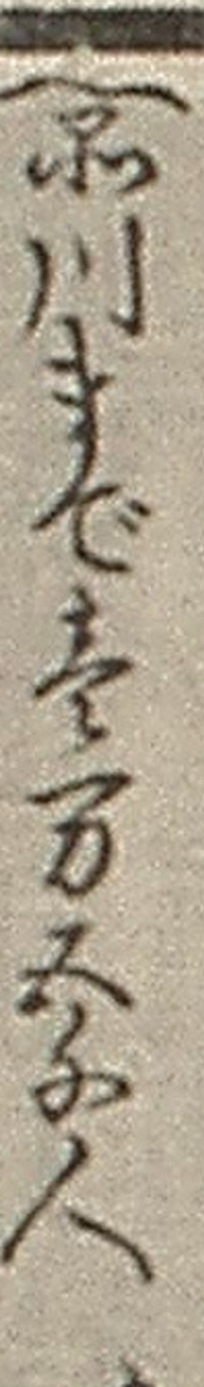品川まで一万五千人
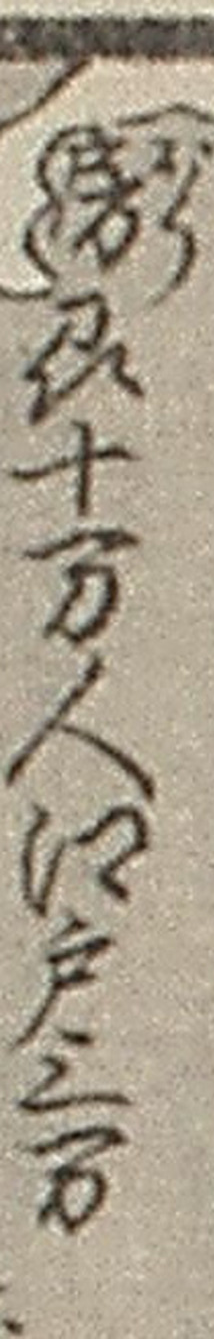房州十万人江戸三万

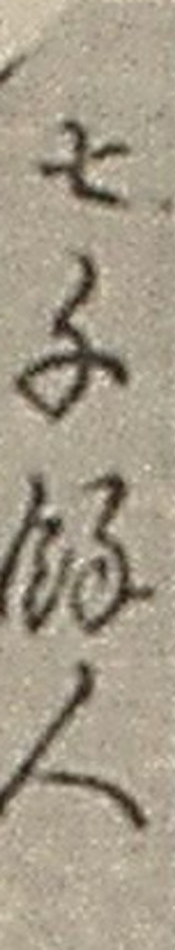七千餘人
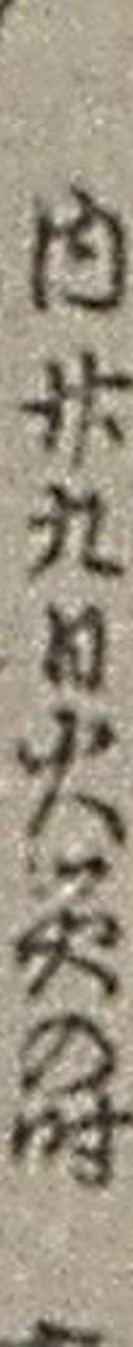内廿九日火災の時
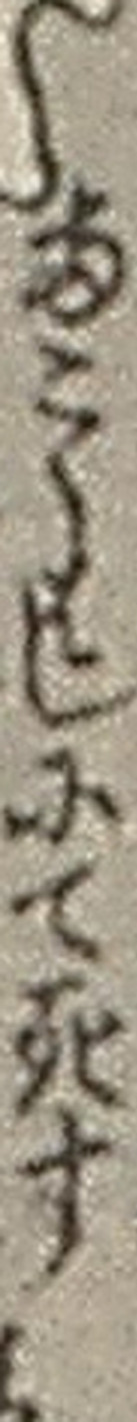両こくはしにて死す
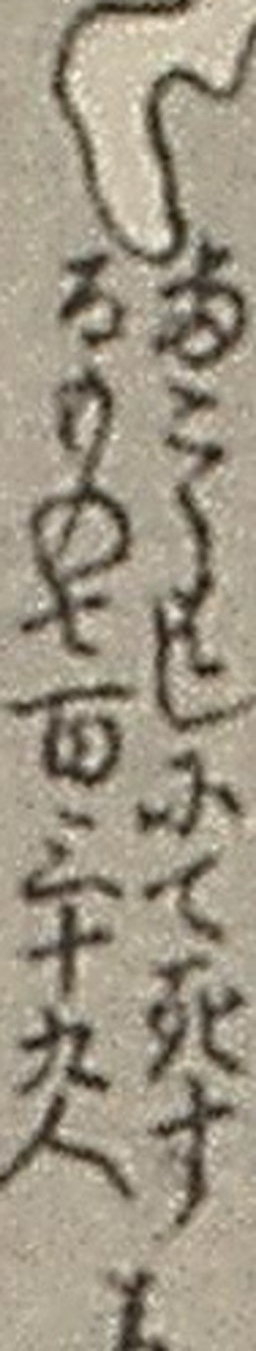るもの七百三十九人
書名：大地震暦年考　全
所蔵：東京大学地震研究所図書室 Earthquake Research Institute Library, The University of Tokyo, JAPAN
